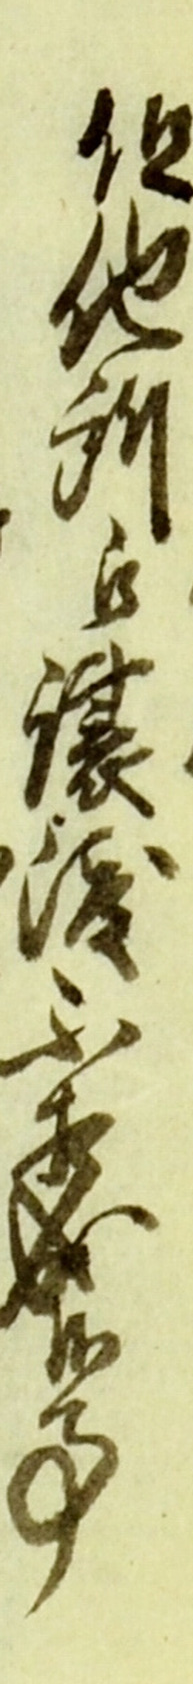但他所江譲渡不相成候事
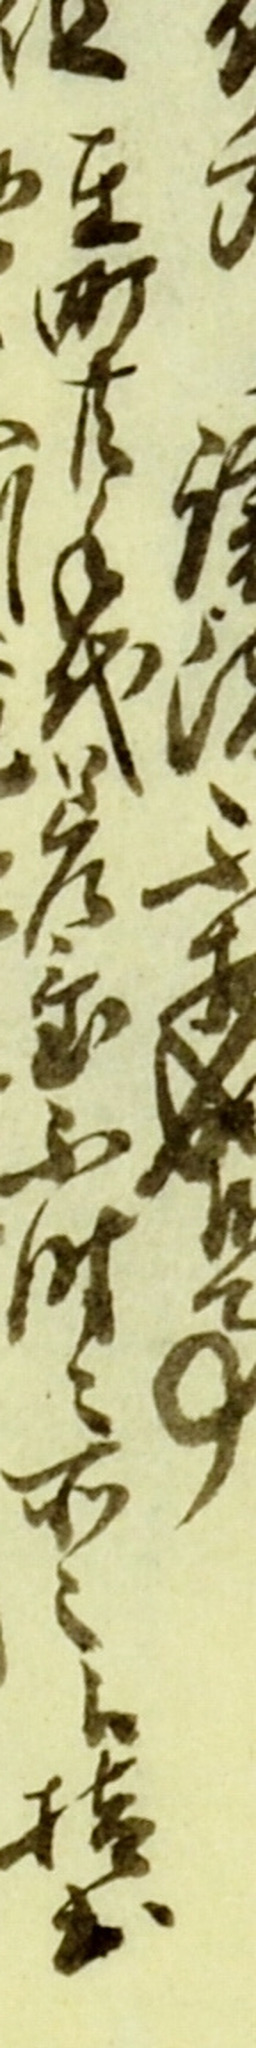但在町共手代差置不時ニ所々江指出
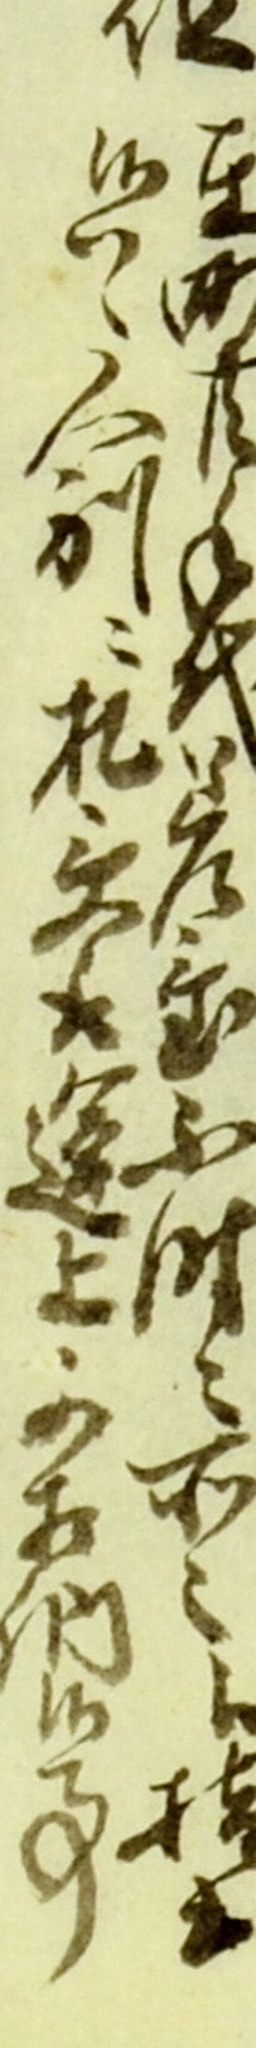候ハゝ人別ニ札受取運上可相納候事
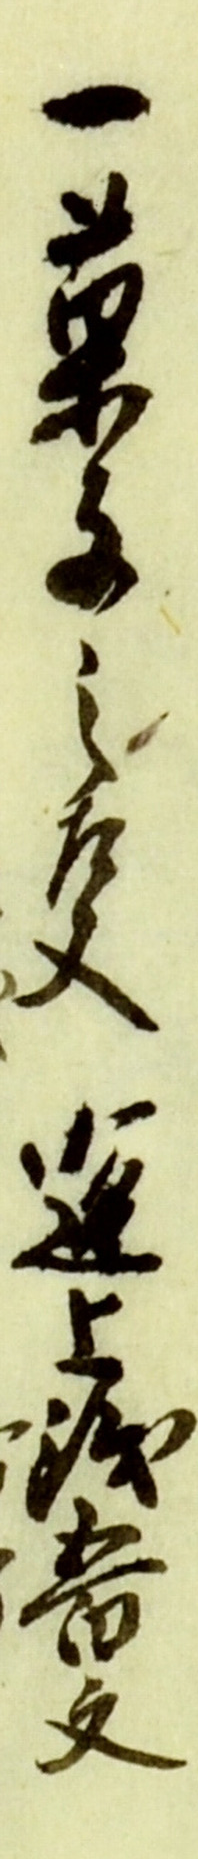一菓子之事運上銭五百文
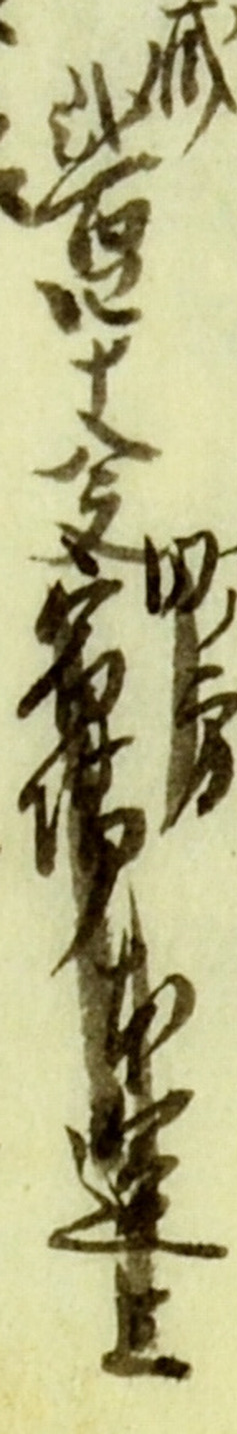半減弐百四十八文町方本運上
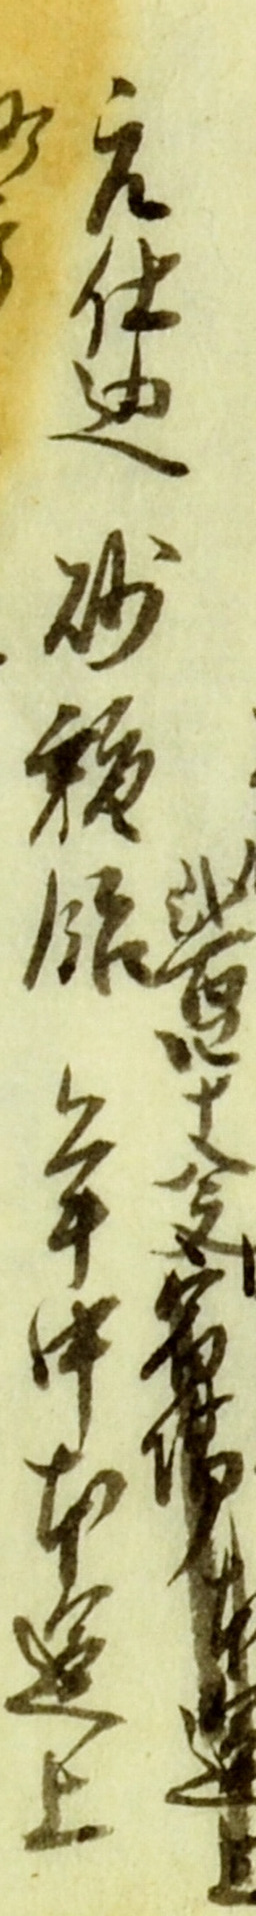元仕込砂糖飴年中本運上
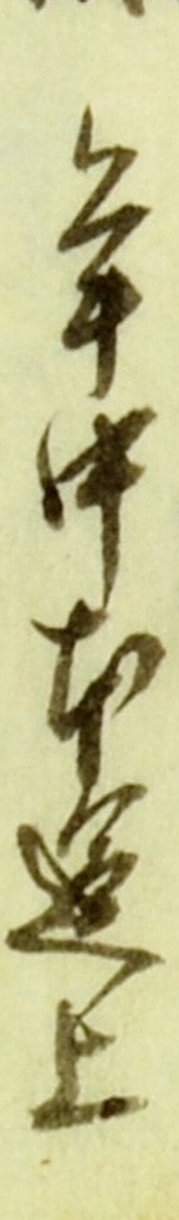町方本運上
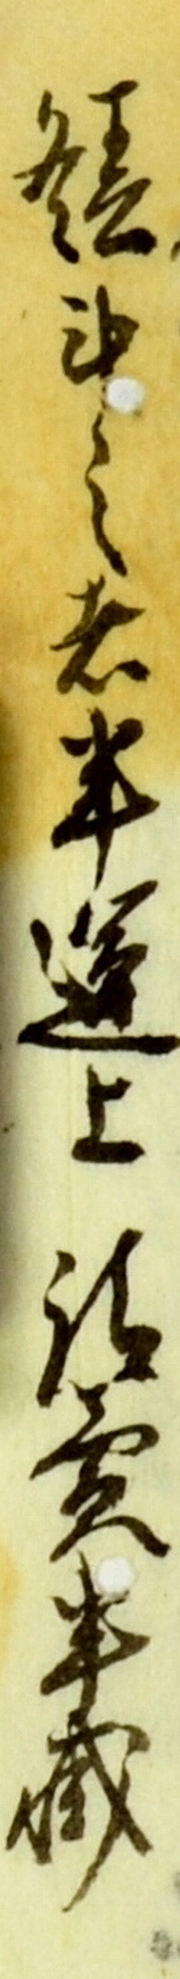春斗之者半運上請売半減

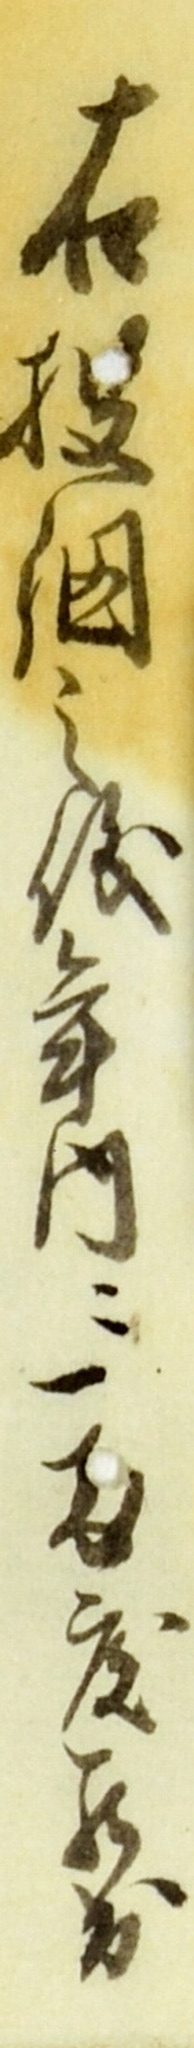右投網之儀年内ニ一両度罷出
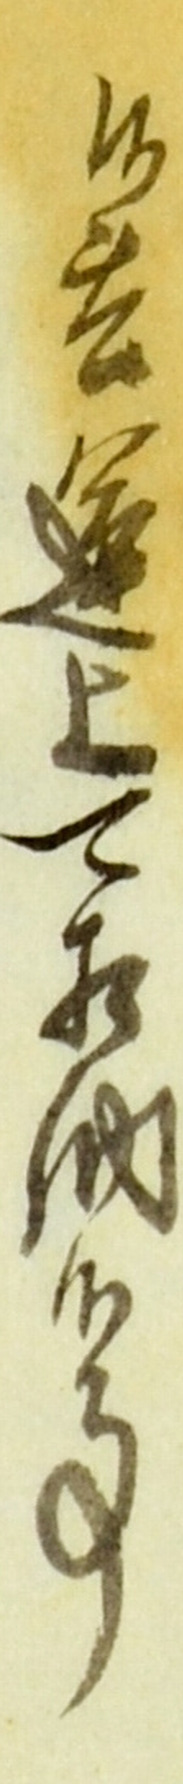候共運上可相納候事
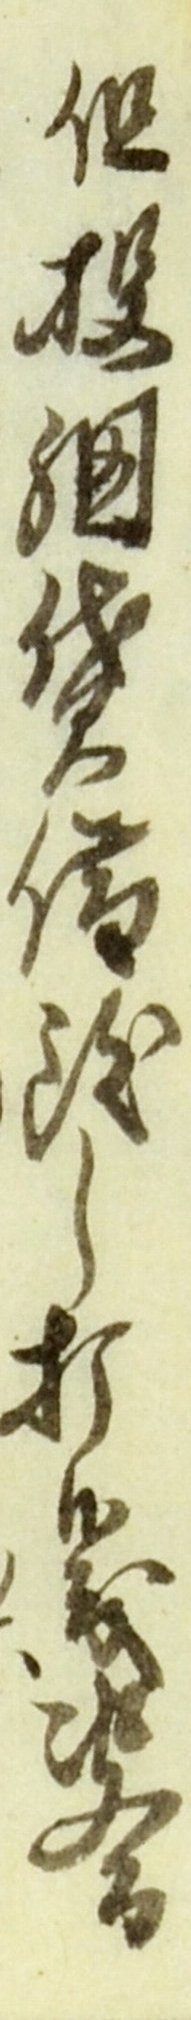但投網貸借致し打候義決而
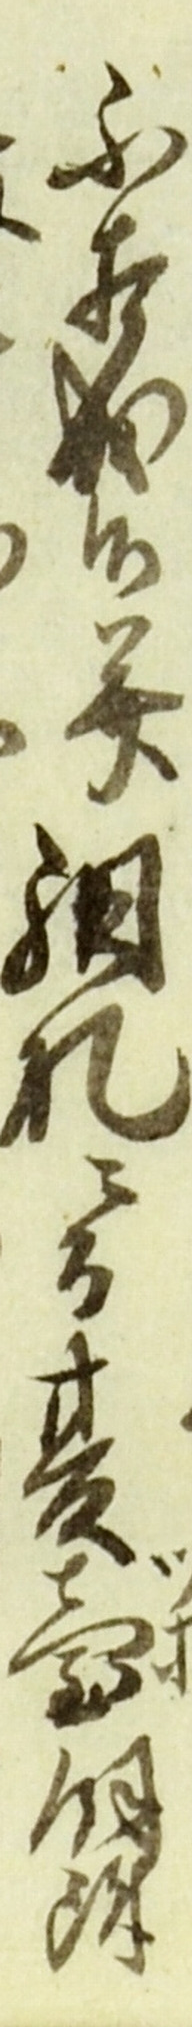不相成候幷網札ニ而夏壺飼附
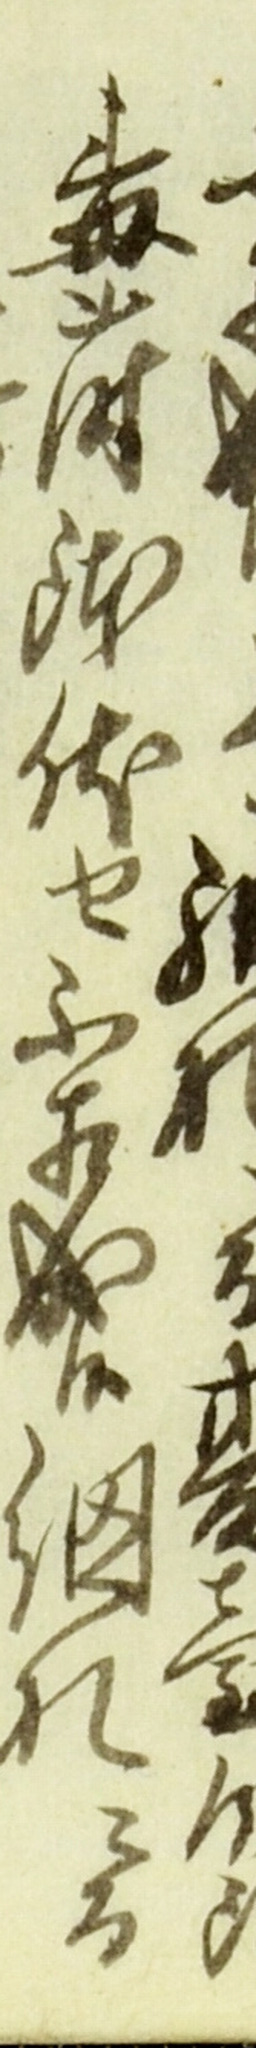毒蒔鉢伏セ不相成候網札ニ而
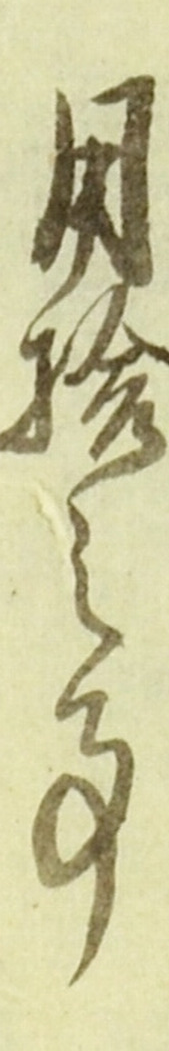用捨之事
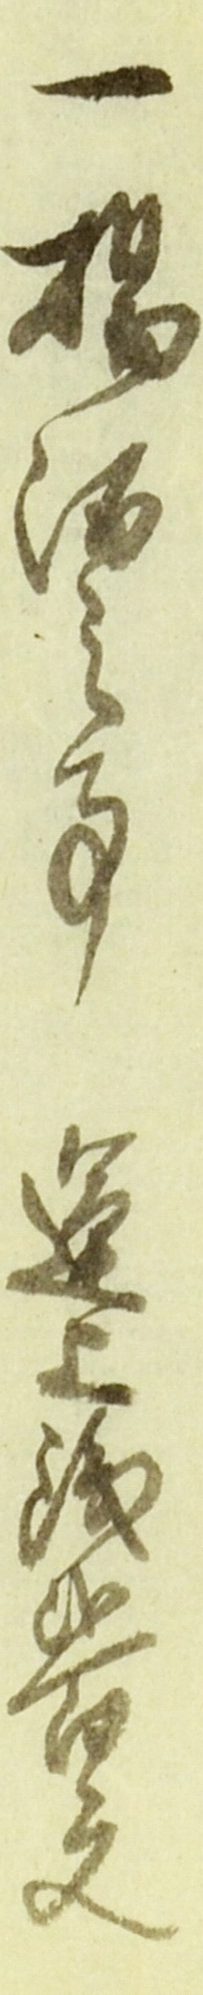一揚酒之事運上銭弐百文
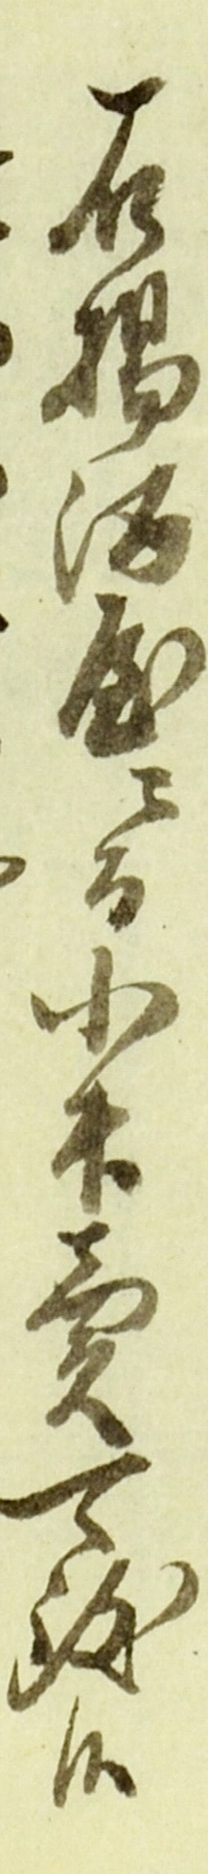右揚酒屋ニ而小升売可致候
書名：分一方諸運上御定法
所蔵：伊那市立高遠町図書館・合同会社AMANE
